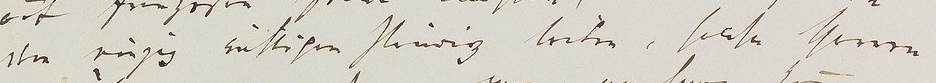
dem einzig richtigen Princip leiten, solche Herren
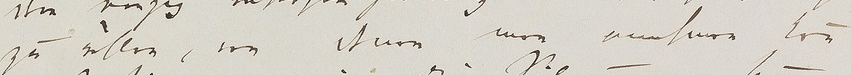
zu wählen, von denen man annehmen kann
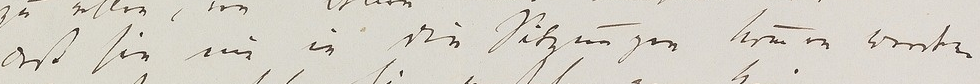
daß sie nie in die Sitzungen kommen werden.
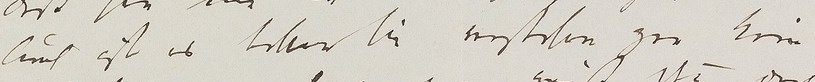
Auch ist es besser sie verstehen gar kein
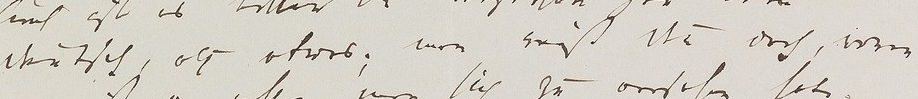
Deutsch, als etwas; man weiß dann doch, woran
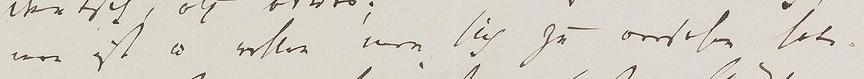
man ist u. wessen man sich zu vorsehen hat.
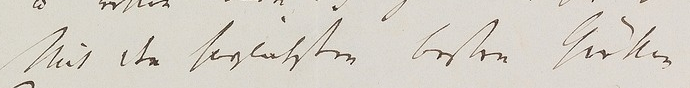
Mit den herzlichsten besten Grüssen
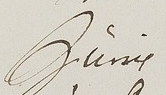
Zürich
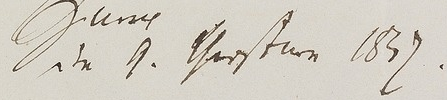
den 9.Christmon 1857.
